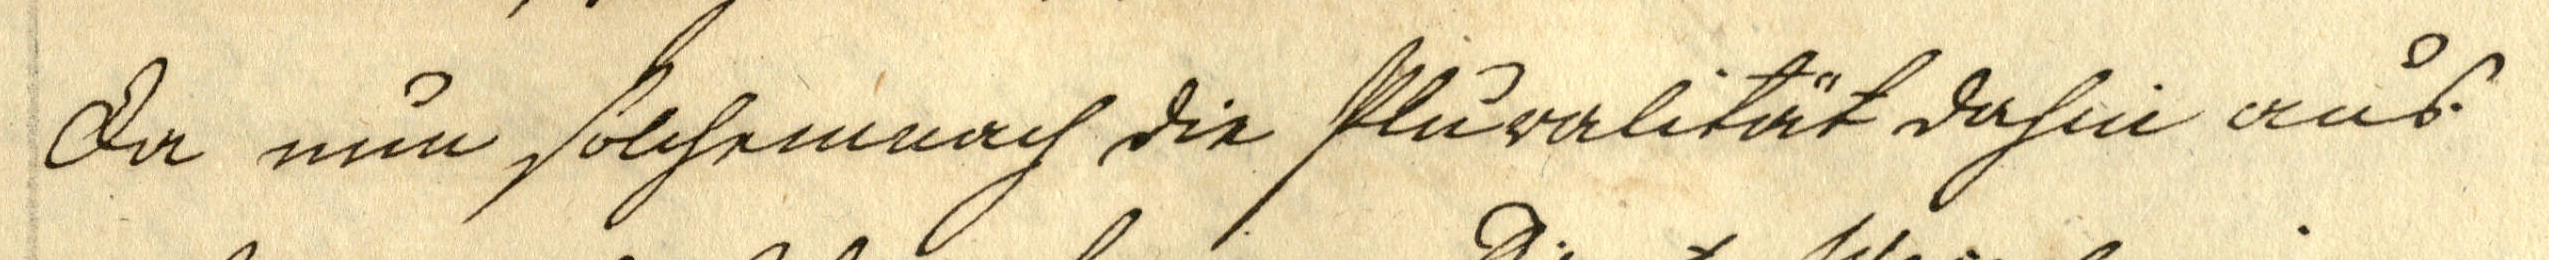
Da nun solchemnach die Pluralität dahin aus-
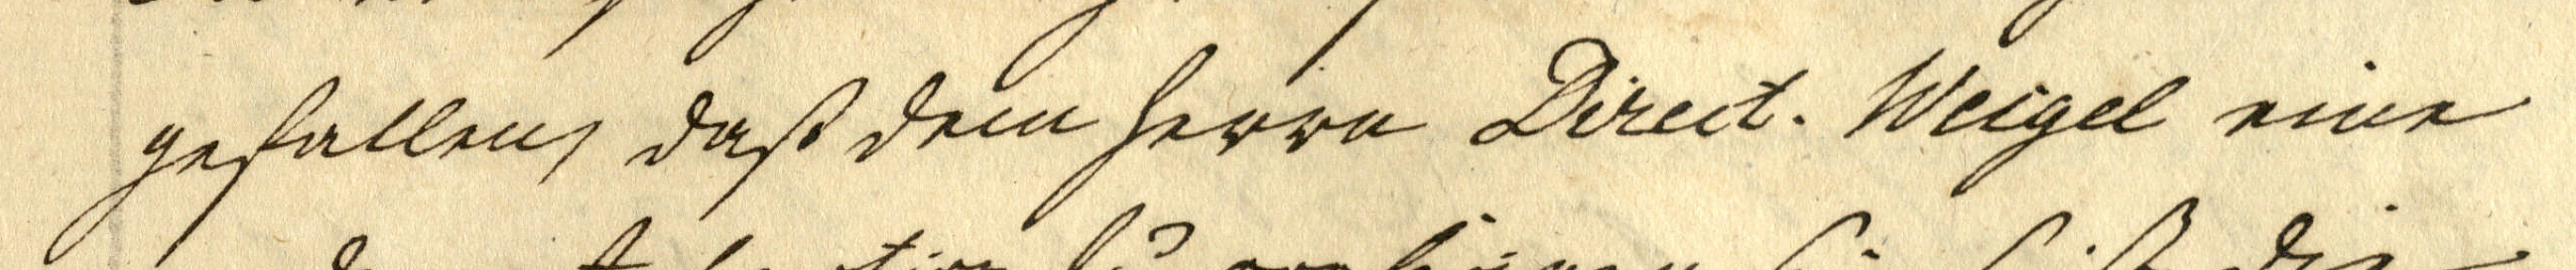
gefallen, daß dem herrn Direct. Weigel eine
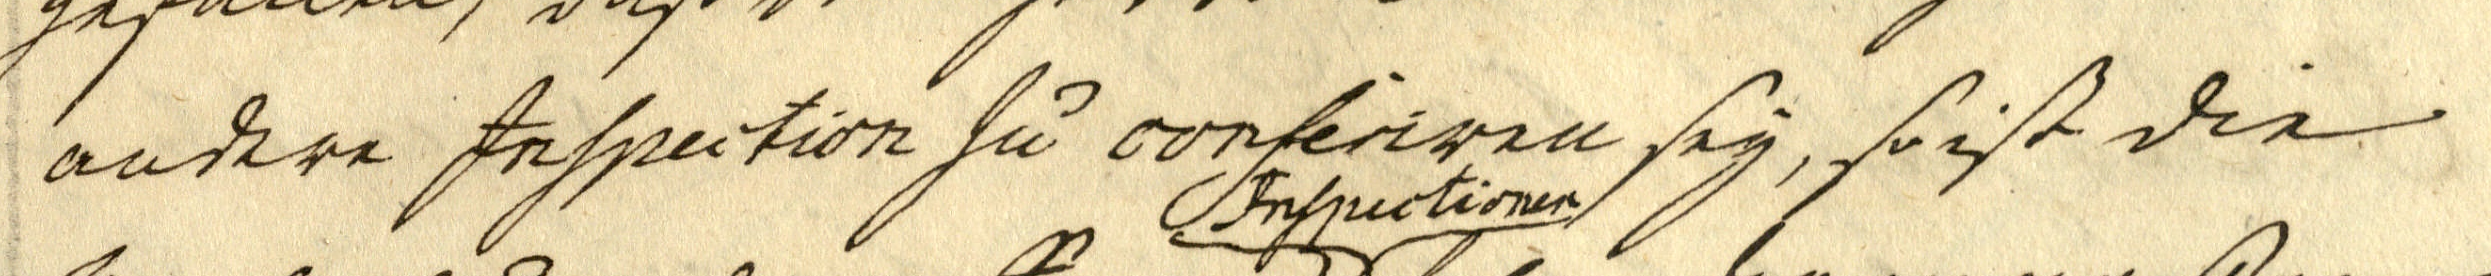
andere Inspection zu conferiren sey, so ist die
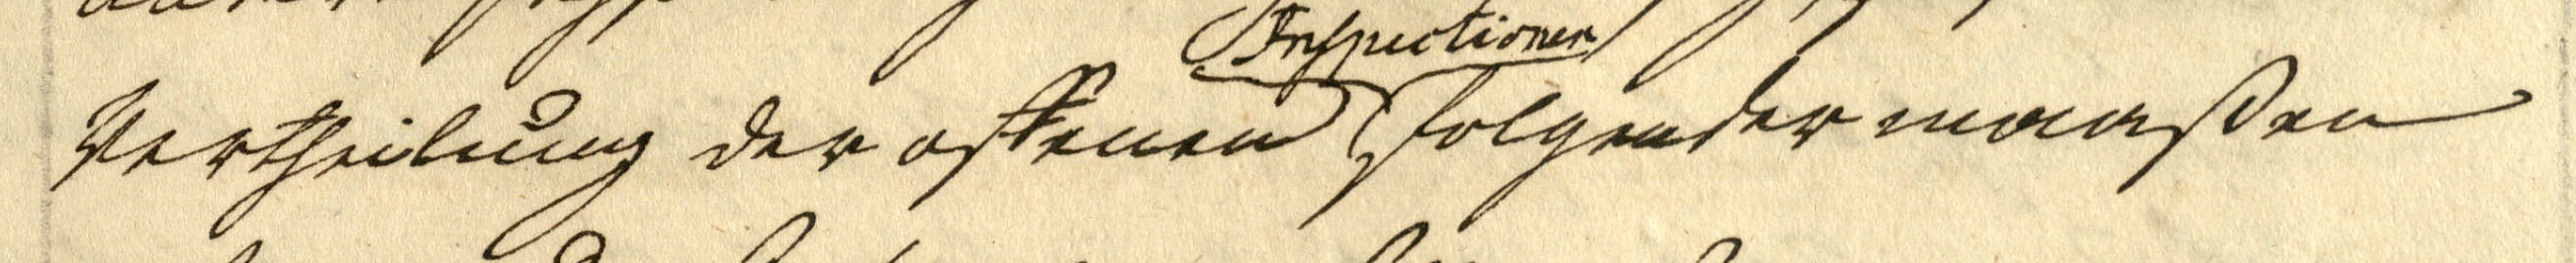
Vertehilung der offenen folgendermaaßen
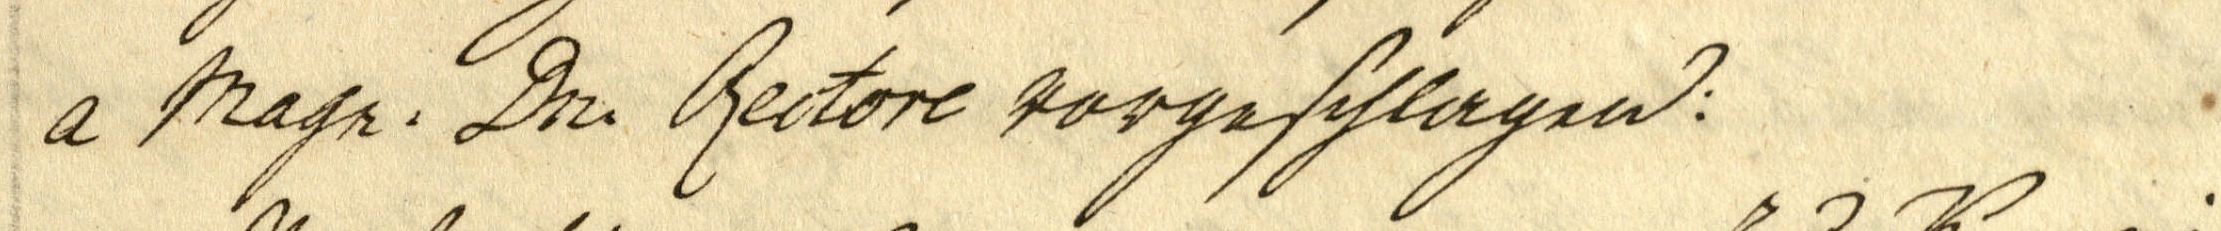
a Magn. Dn. Rectore vorgeschlagen:
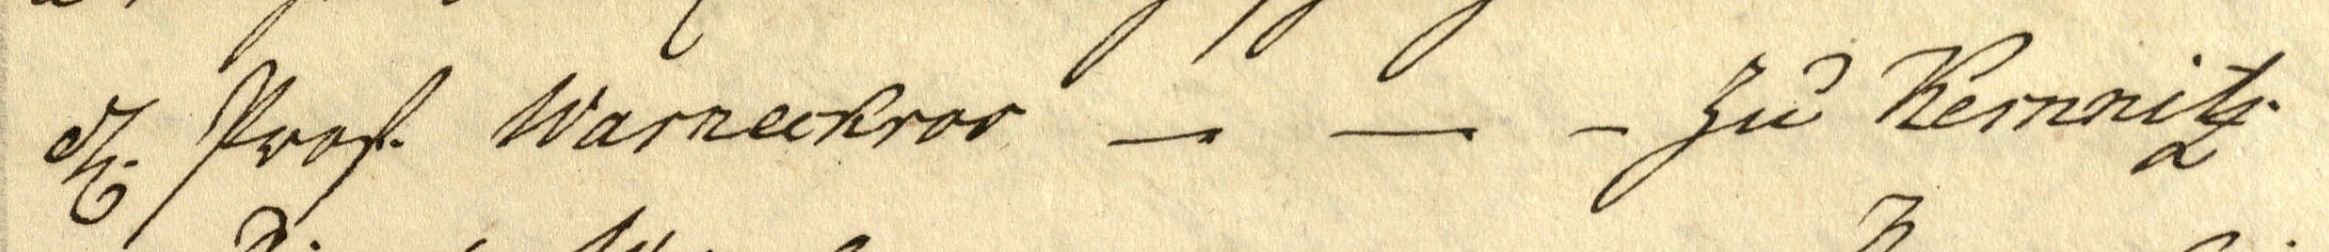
dh. Prof. Warneckros - - - zu Kemnitz.
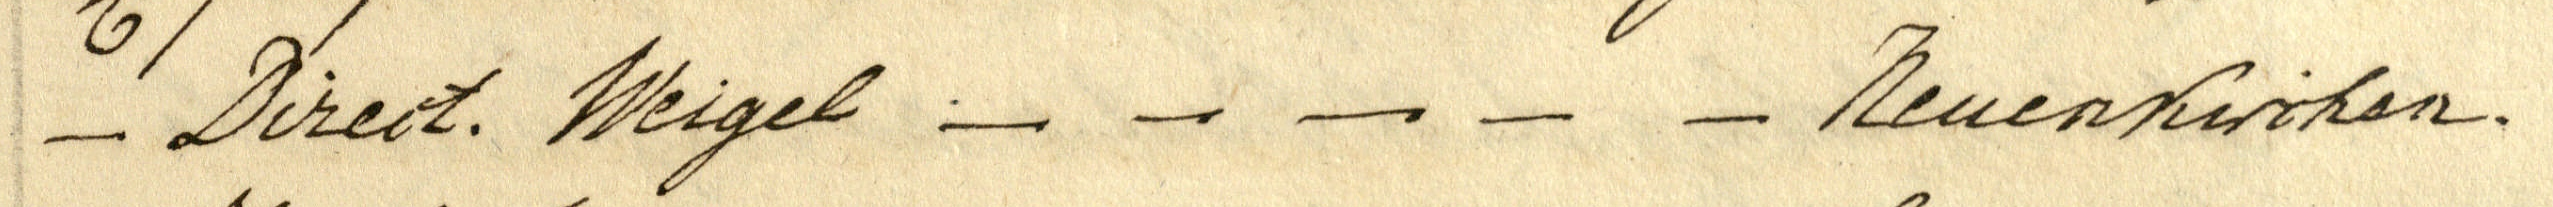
- Direct. Weigel - - - - - Neuenkrichen.
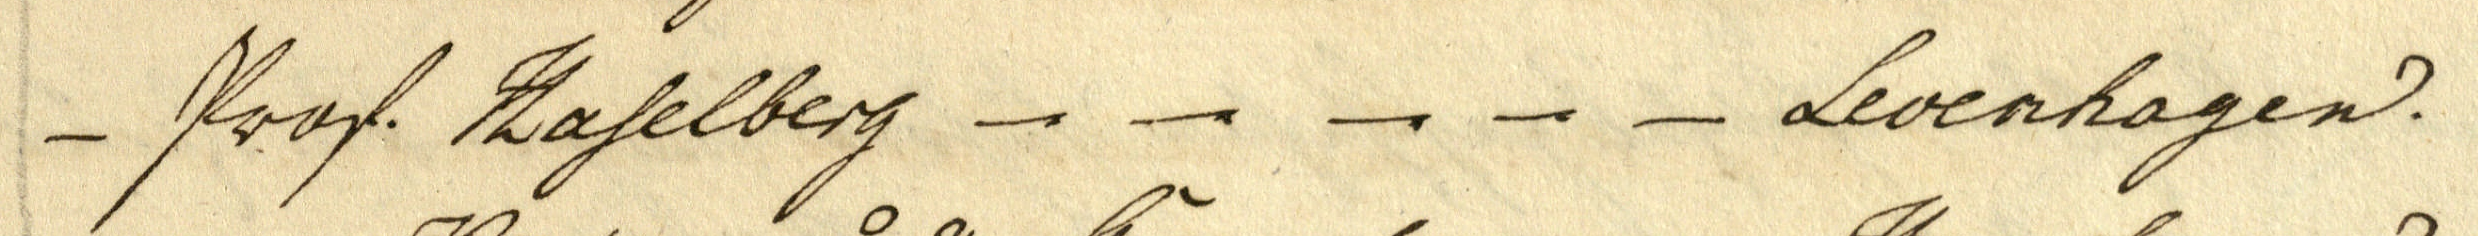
- Prof. Haselberg - - - - - Levenhagen.
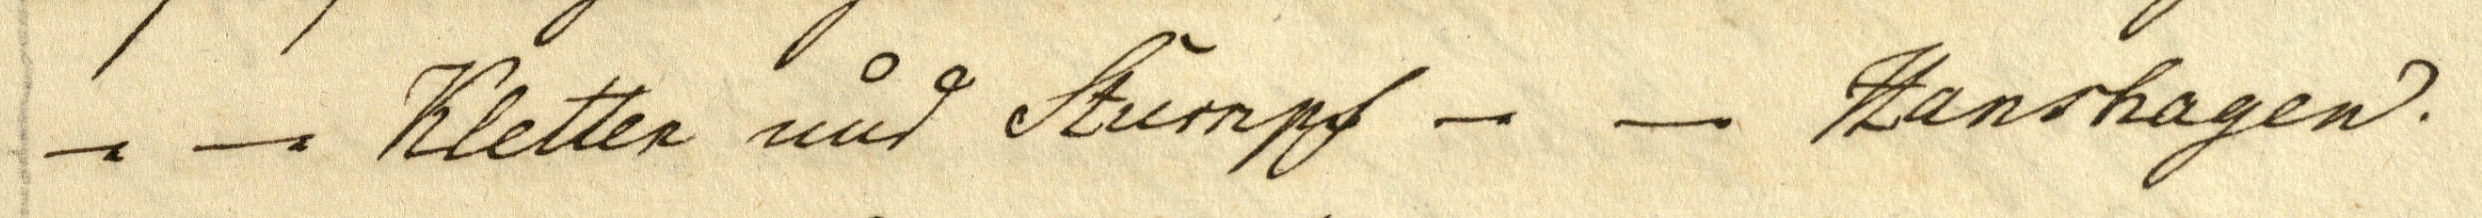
- - Kletten und Stumpf - - Hanshagen.
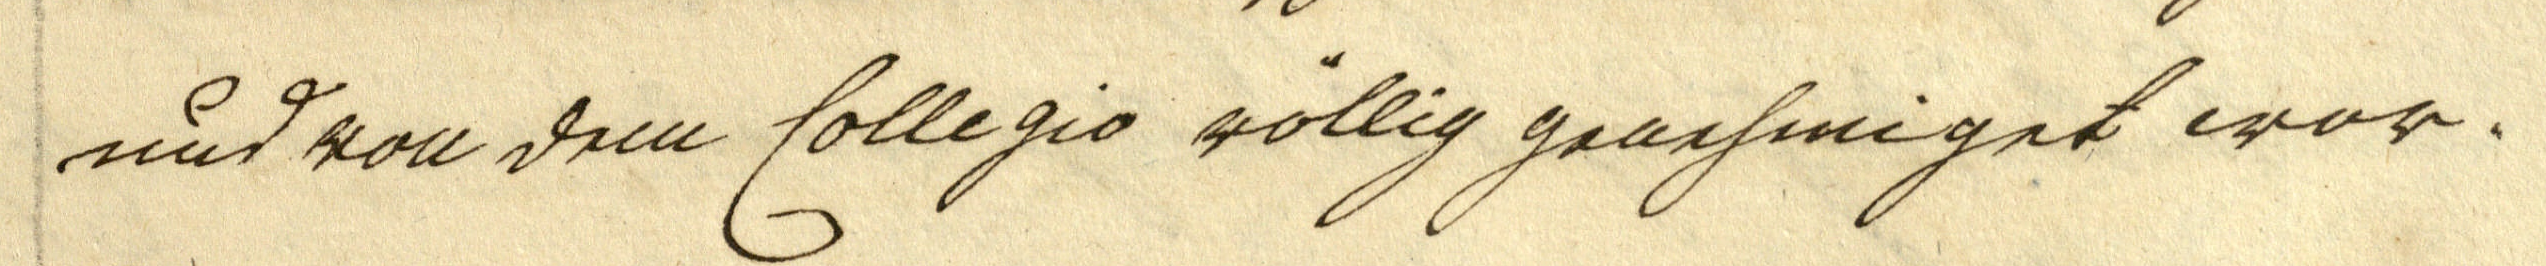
und von dem Collegio völlig genehmiget wor-
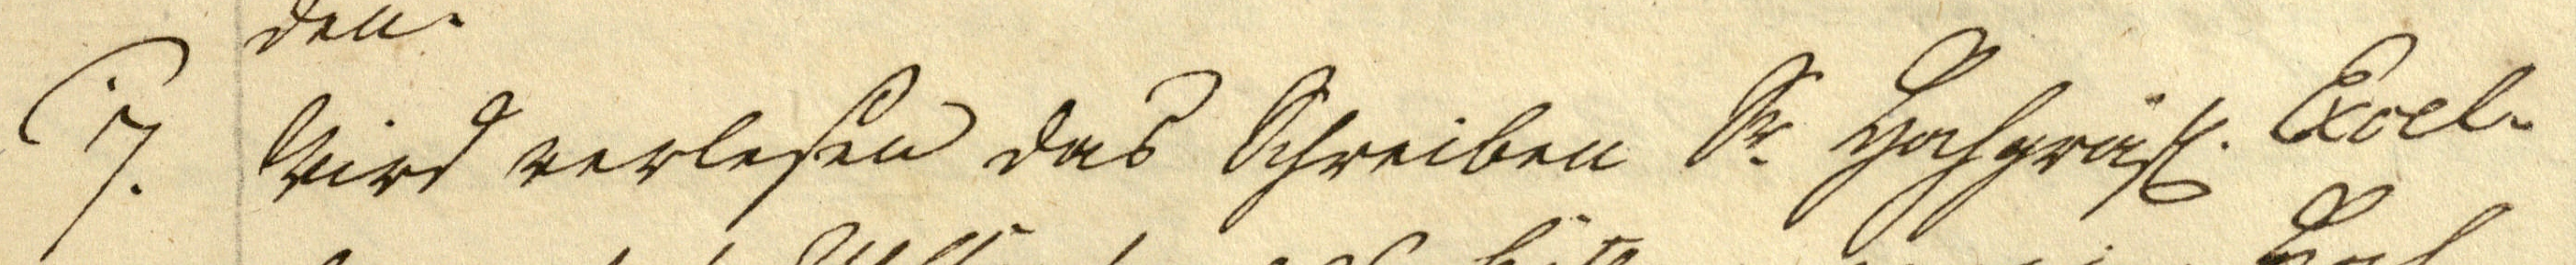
7. Wird verlesen das Schreiben Sr. Hochgräfl. Excel-
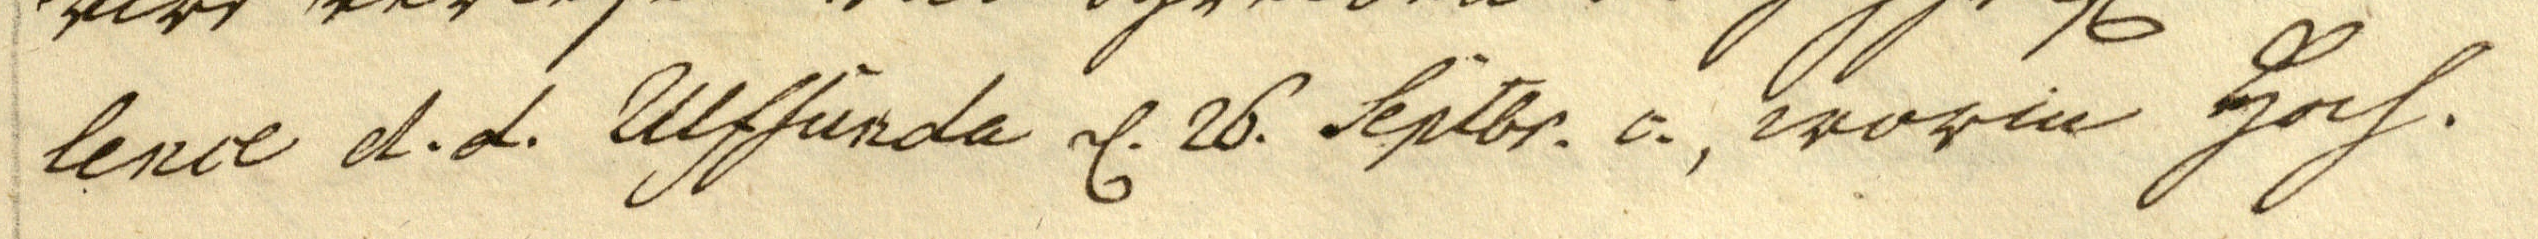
lence d.d. Ulfhunda d. 26. Septbr. c., worin Hoch-
